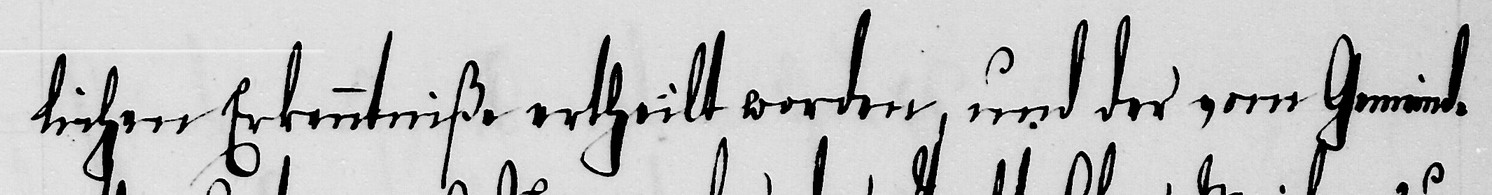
lichen Erkenntniße ertheilt worden, und der vom Gemeind¬
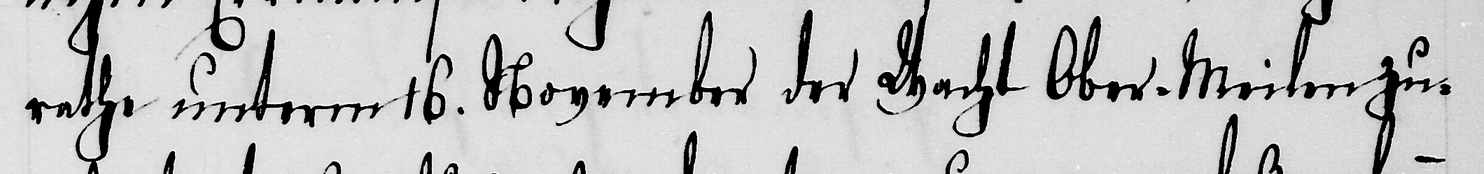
rathe unterm 16. November der Wacht Ober-Meilen zu¬
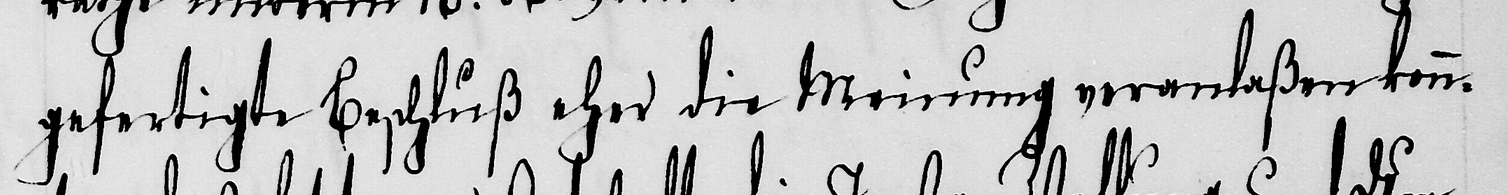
gefertigte Beschluß eher die Meinung veranlaßen kon¬
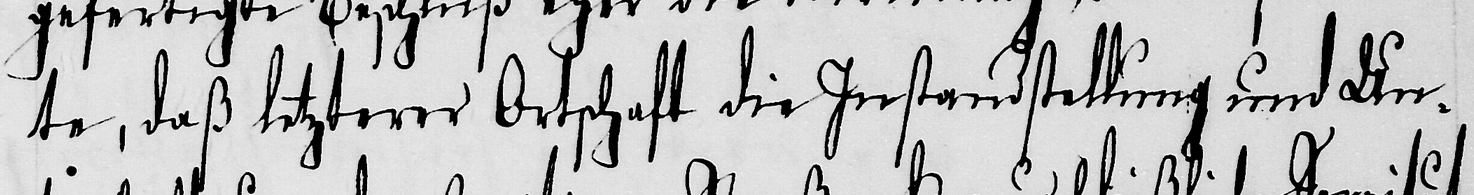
nte, daß letzterer Ortschaft die Instandstellung und Un¬
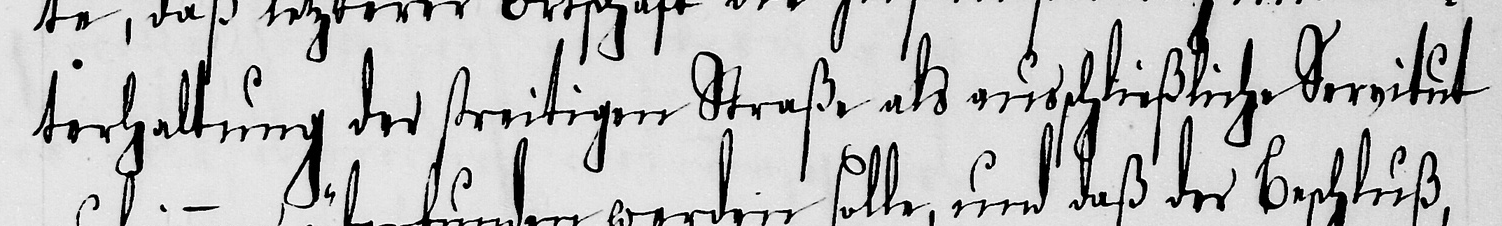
terhaltung der streitigen Straße als ausschließliche Servitut
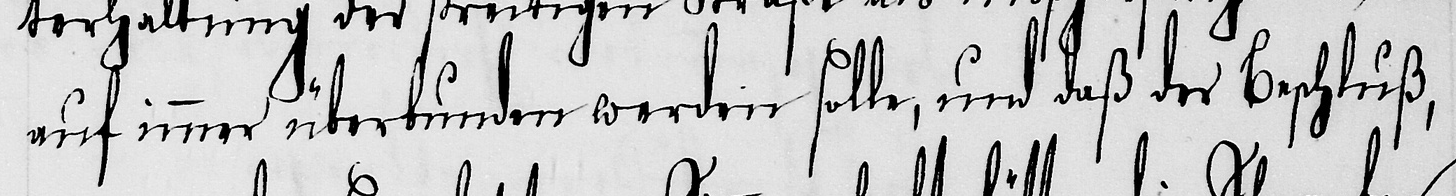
auf immer überbunden werden solle, und daß der Beschluß,
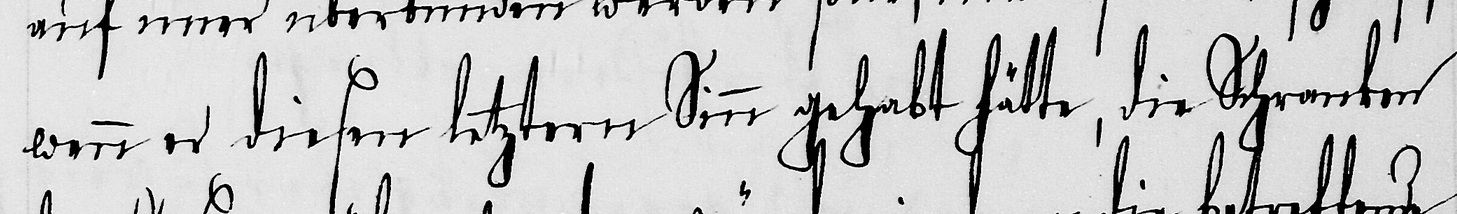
wenn er diesen letztern Sinn gehabt hätte, die Schranken
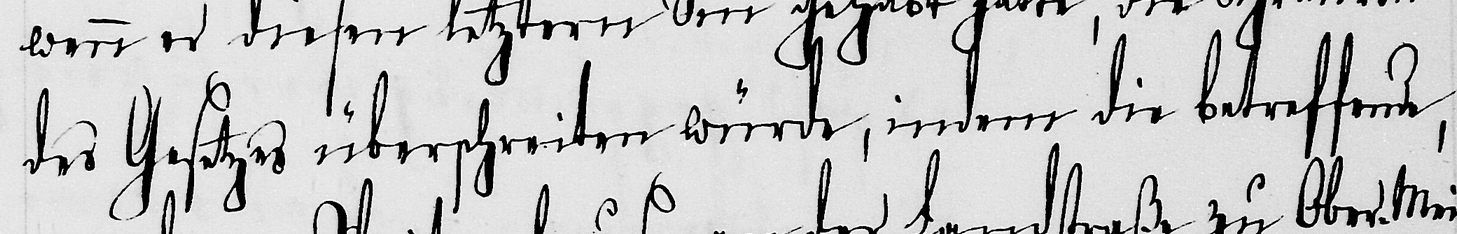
des Gesetzes überschreiten würde, indem die betreffend¬
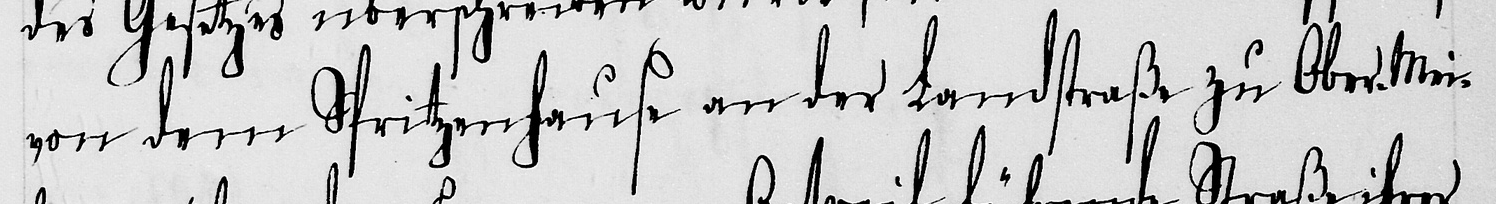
von dem Spritzenhause an der Landstraße zu Ober-Mei¬
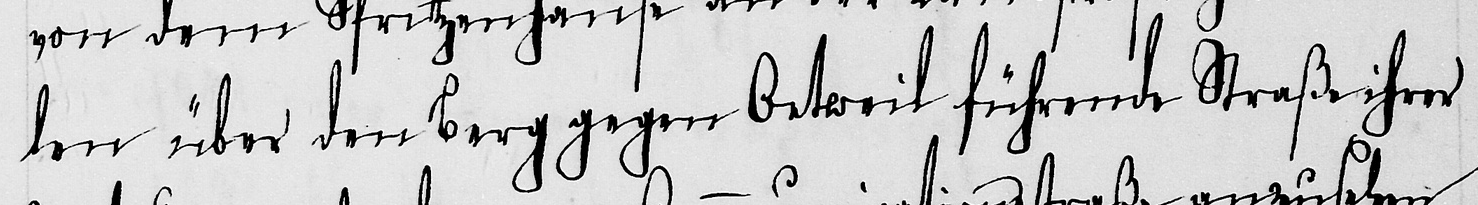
len über den Berg gegen Oetweil führende Straße ihrer
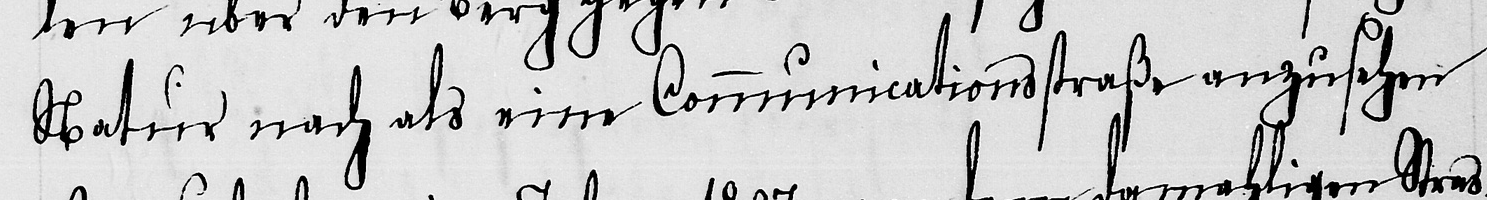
Natur nach als eine Communicationsstraße anzusehen
